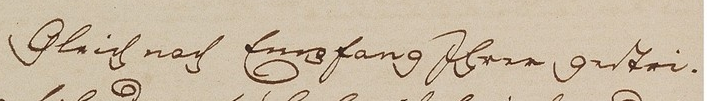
Gleich nach Empfang Ihrer gestri-
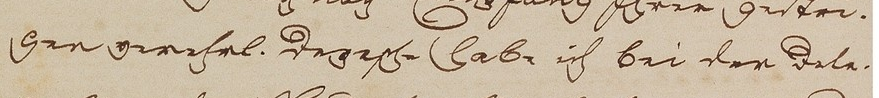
gen verehrl. Depesche habe ich bei der Dele-
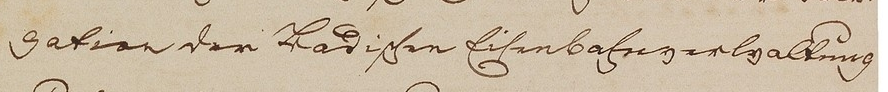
gation der Badischen Eisenbahnverwaltung
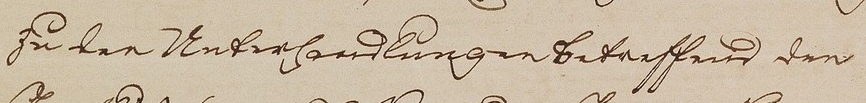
zu den Unterhandlungen betreffend den
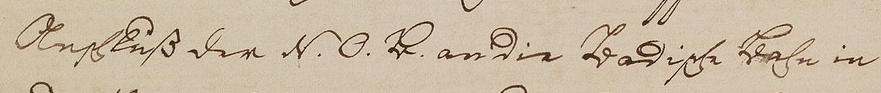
Anschluß der N.O.B. an die Badische Bahn in
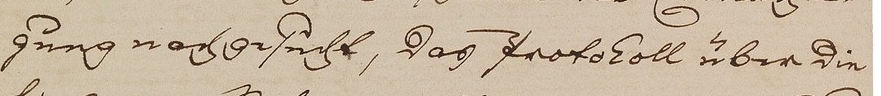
gung nachgesucht, das Protokoll über die
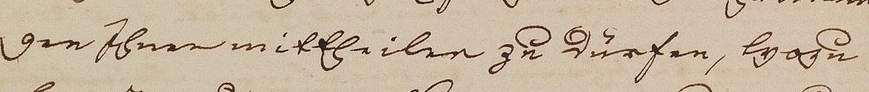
gen Ihnen mittheilen zu dürfen, wozu
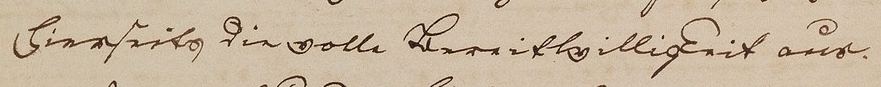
hierseits die volle Bereitwilligkeit aus-
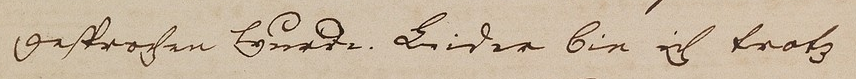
gesprochen wurde. Leider bin ich trotz
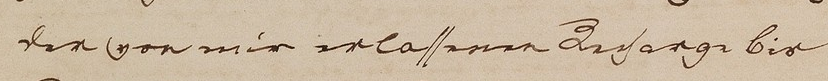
der von mir erlassenen Recharge bis
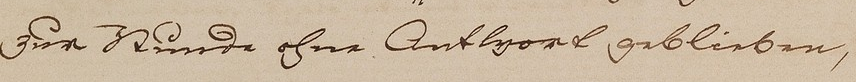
zur Stunde ohne Antwort geblieben,
